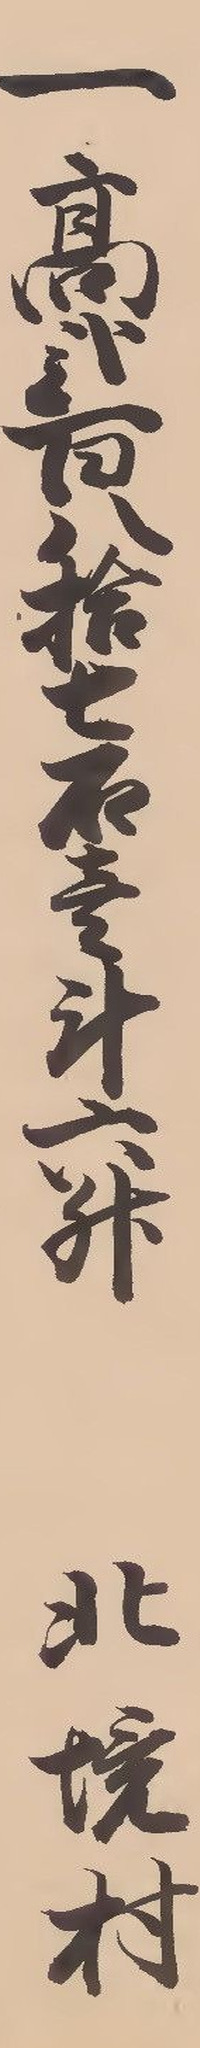一高弐百八拾七石壱斗六升北境村
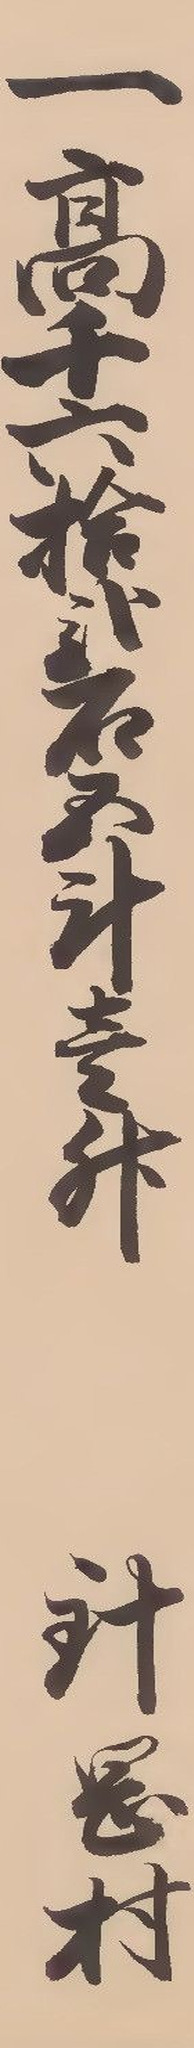一高千六拾弐石五斗壱升針岡村
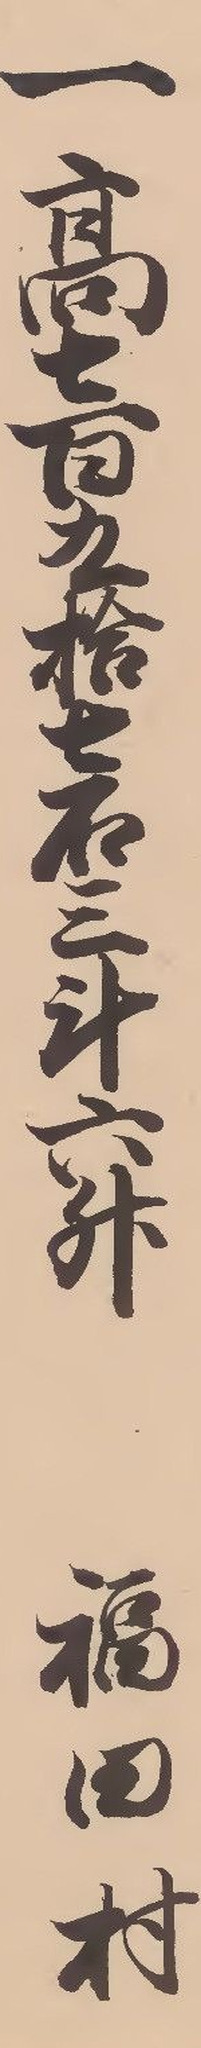一高七百九拾七石三斗六升福田村
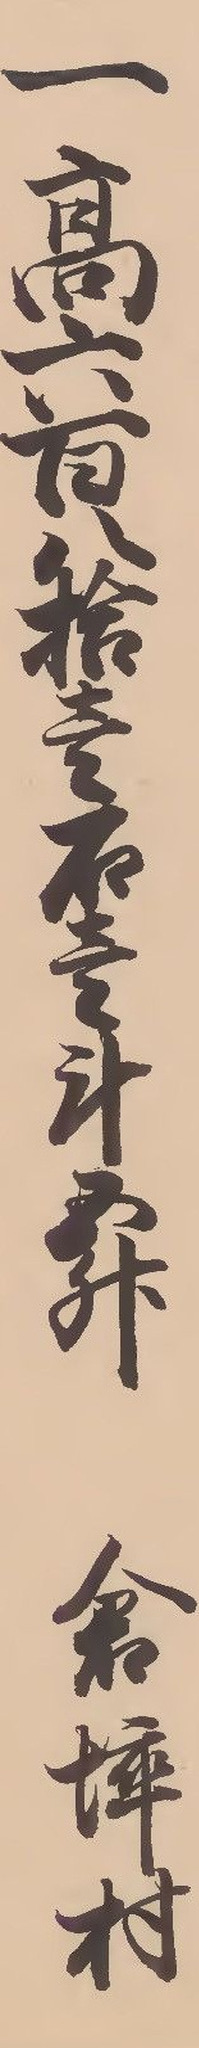一高六百八拾壱石壱斗五升倉埣村

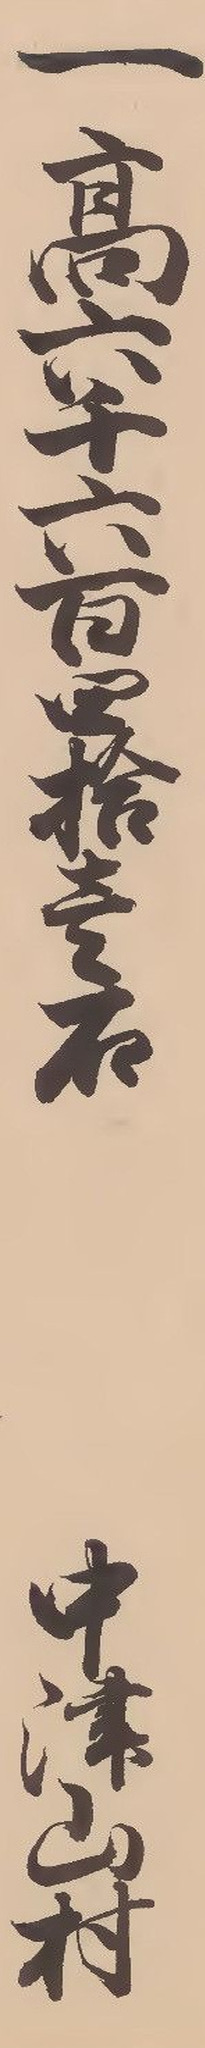一高六千六百四拾壱石中津山村
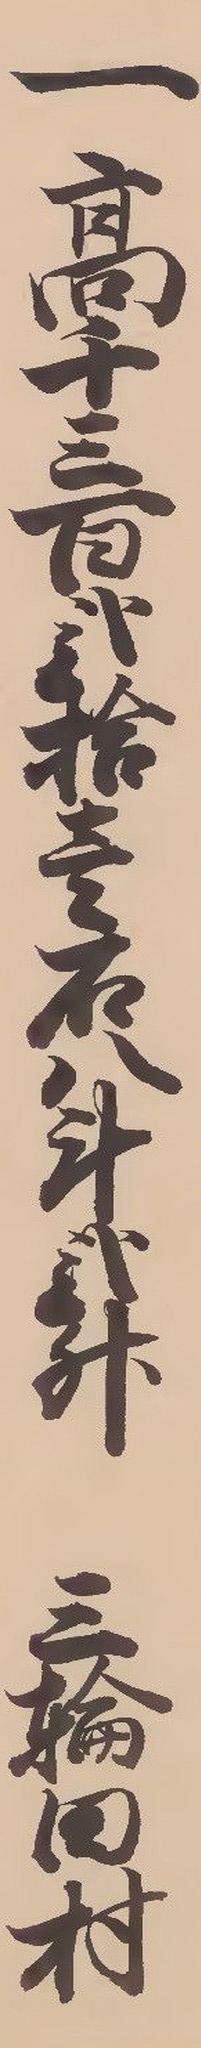一高千三百弐拾壱石八斗弐升三輪田村
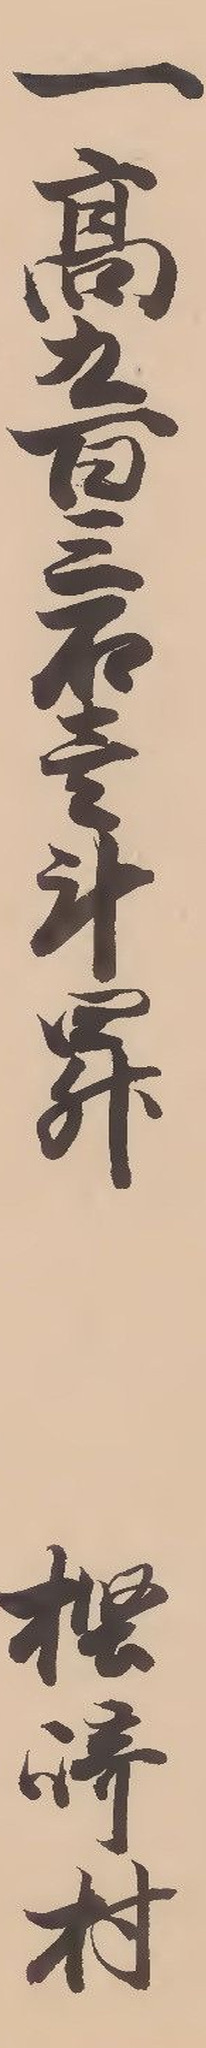一高九百三石壱斗四升樫崎村
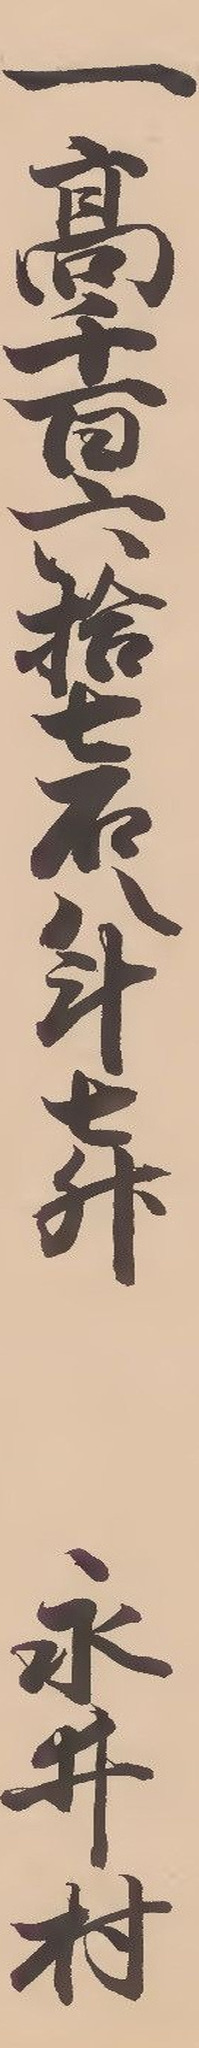一高千百六拾七石八斗七升永井村
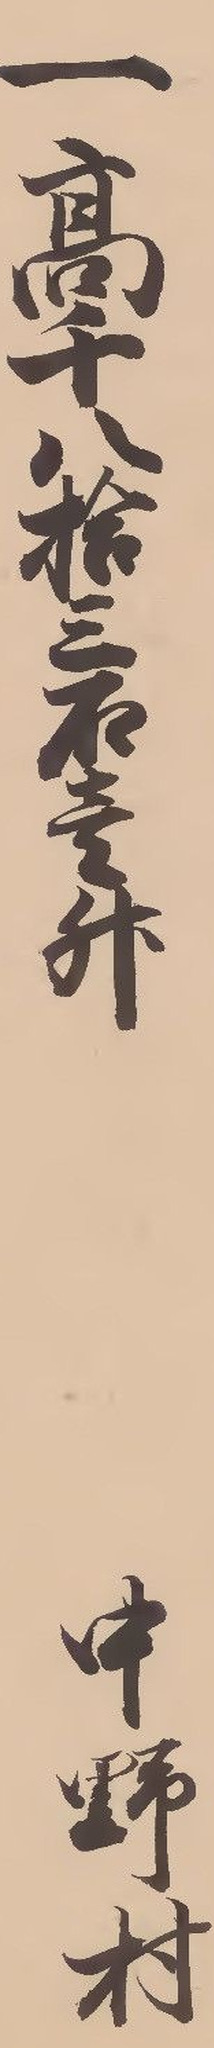一高千八拾三石壱升中野村
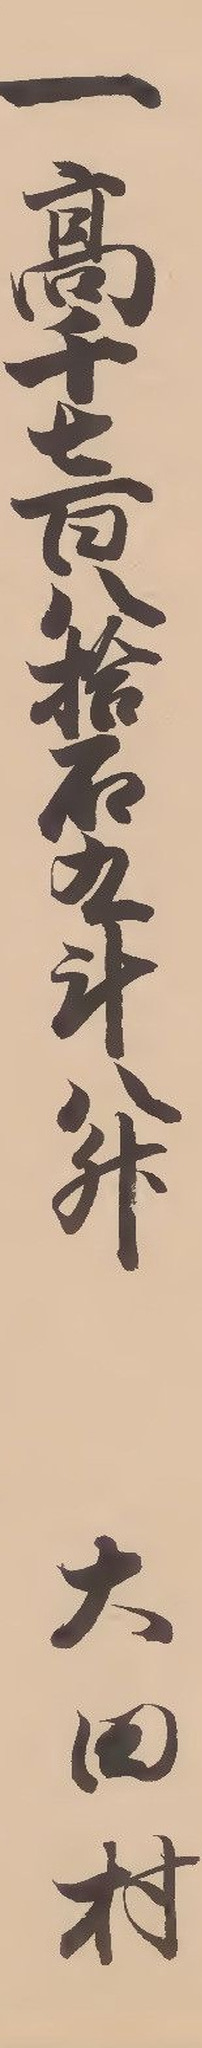一高千七百八拾石九斗八升大田村
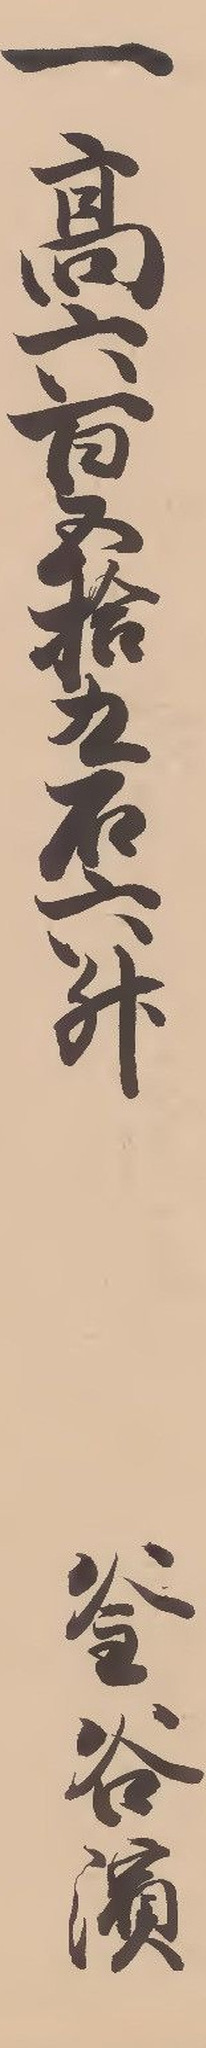一高六百五拾九石六升釜谷浜
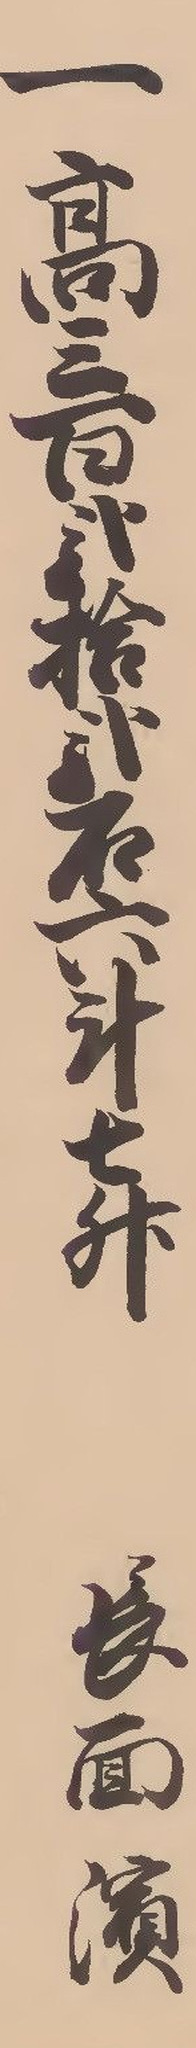一高三百弐拾弐石六斗七升長面浜

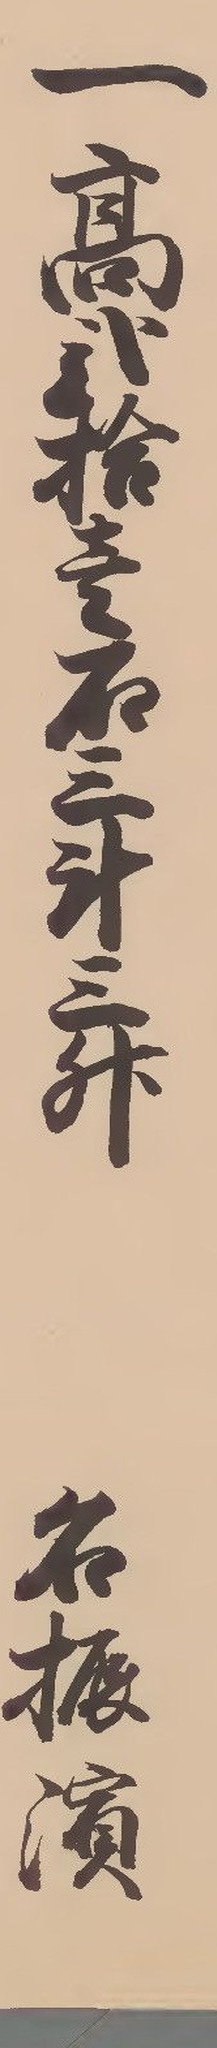一高弐拾壱石三斗三升名振浜
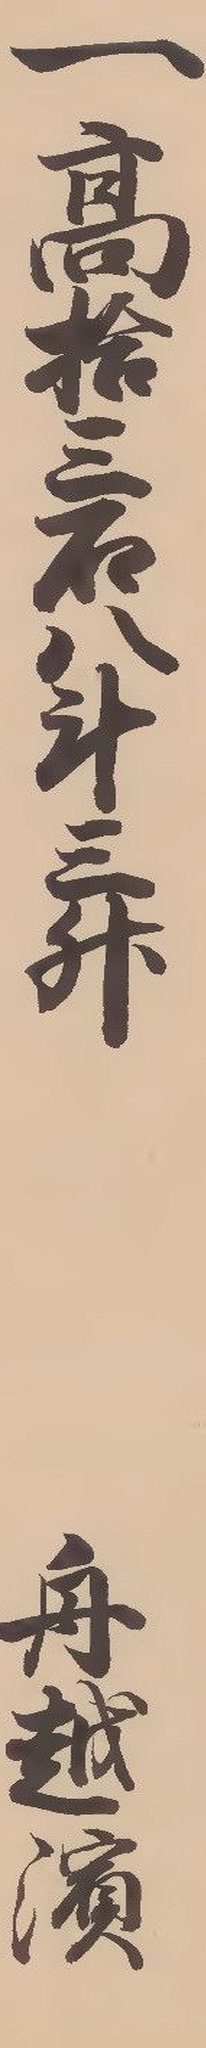一高拾三石八斗三升舟越浜
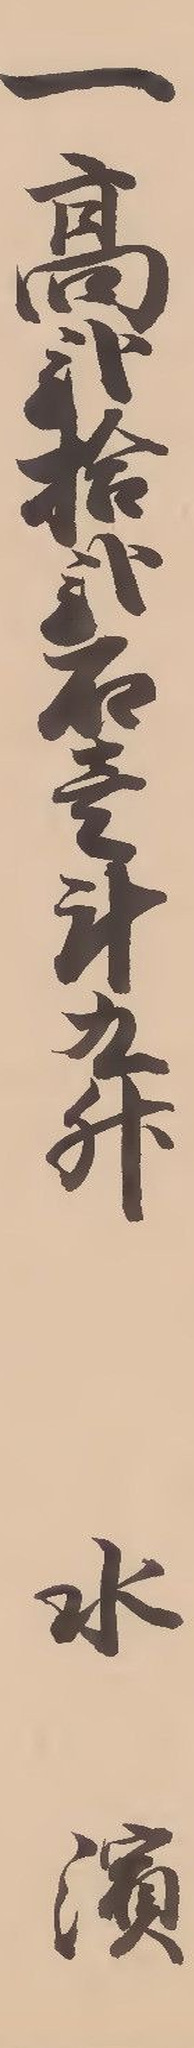一高弐拾弐石壱斗九升水浜

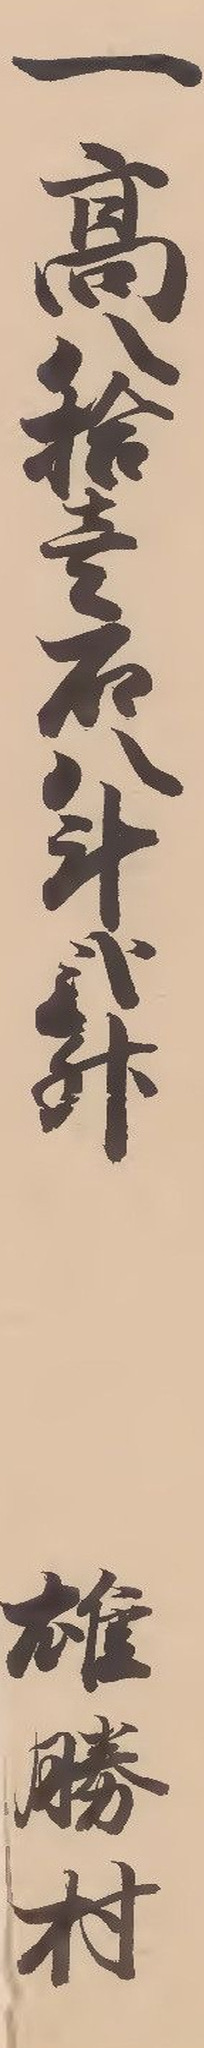一高八拾壱石八斗弐升雄勝村
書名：陸奥国郷帳　５
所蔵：国立公文書館 National Archives of Japan
